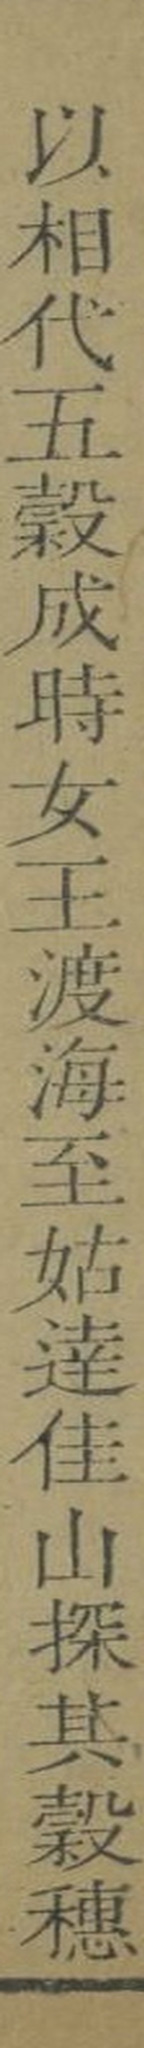以相代五穀成時女王渡海至姑達佳山探其穀穂
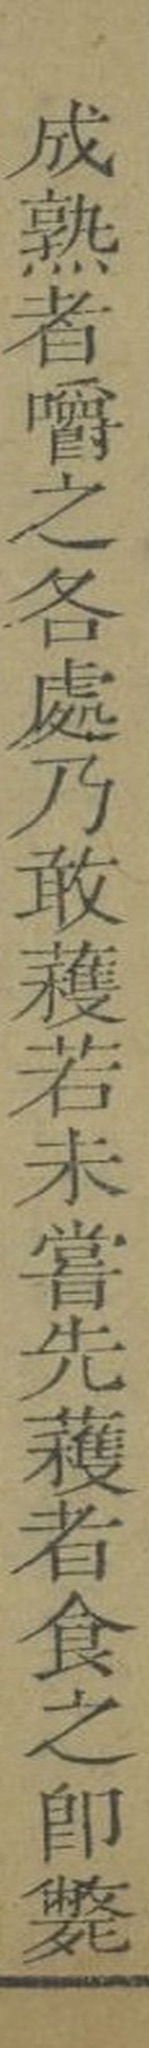成熟者嚼之各処乃敢穫若未嘗先穫者食之即斃
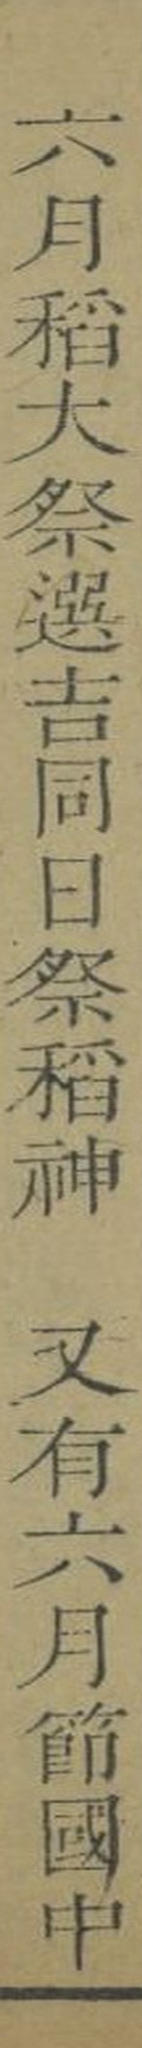六月稲大祭選吉同日祭稲神又有六月節国中
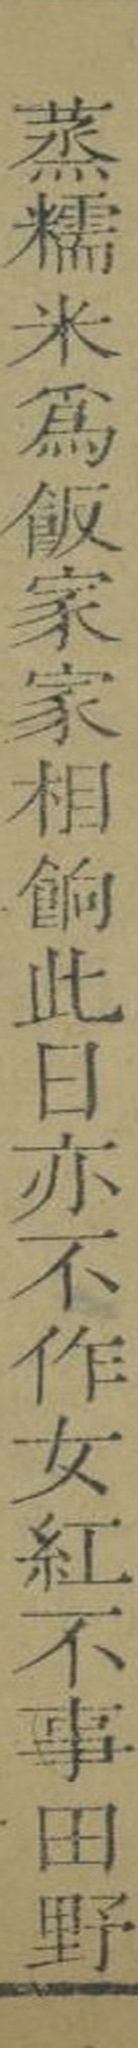蒸糯米為飯家家相餉此日亦不作女紅不事田野
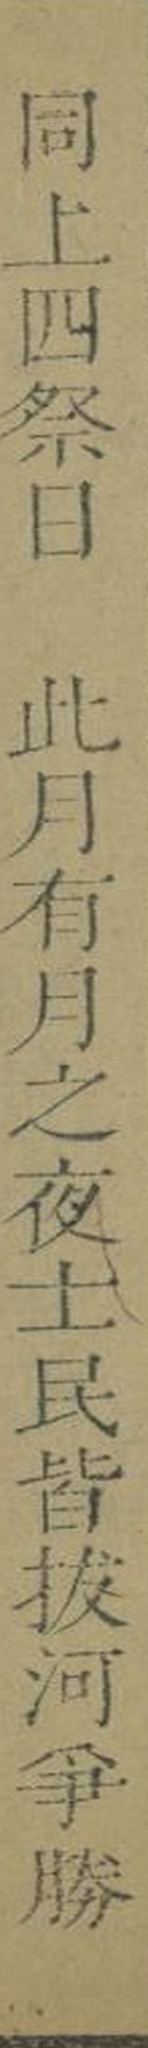同上四祭日此月有月之夜士民皆抜河争勝
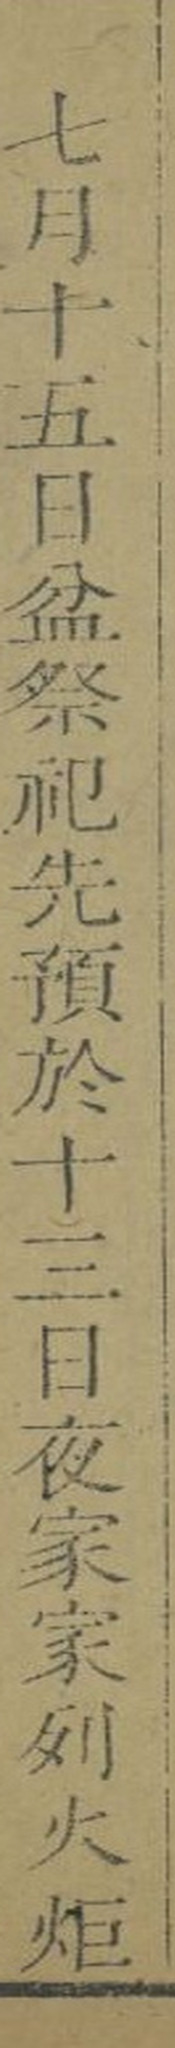七月十五日盆祭祀先預於十三日夜家家列火炬
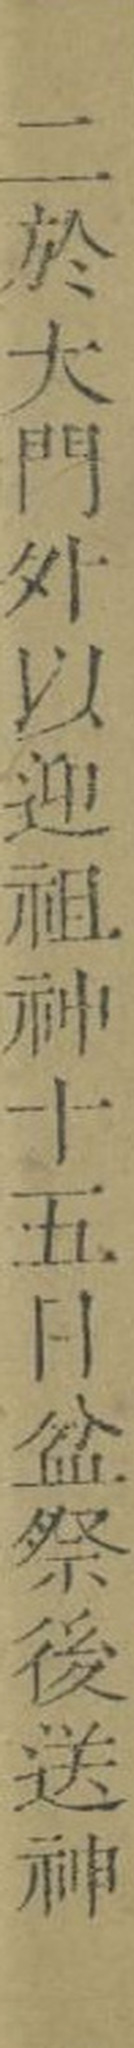二於大門外以迎祖神十五日盆祭後送神
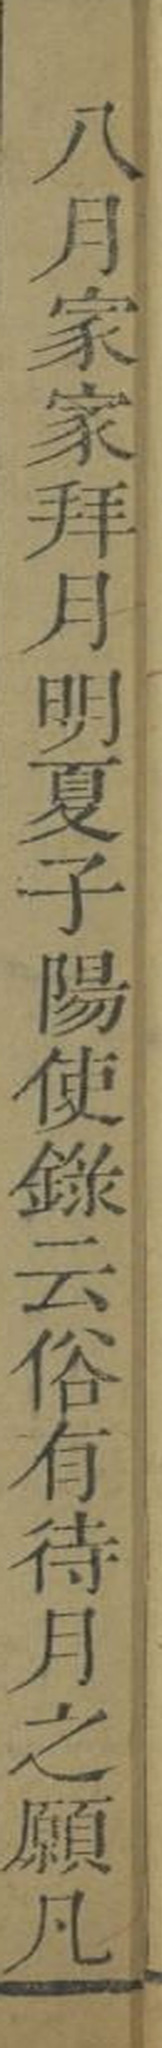八月家家拝月明夏子陽使録云俗有待月之願凡
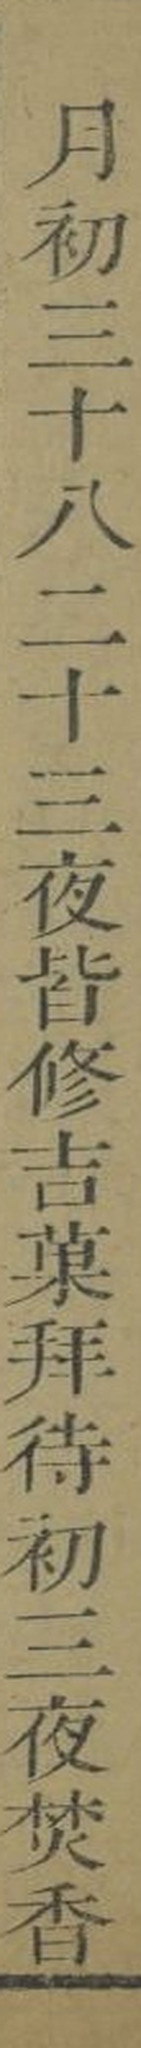月初三十八二十三夜皆修吉菓拝待初三夜焚香
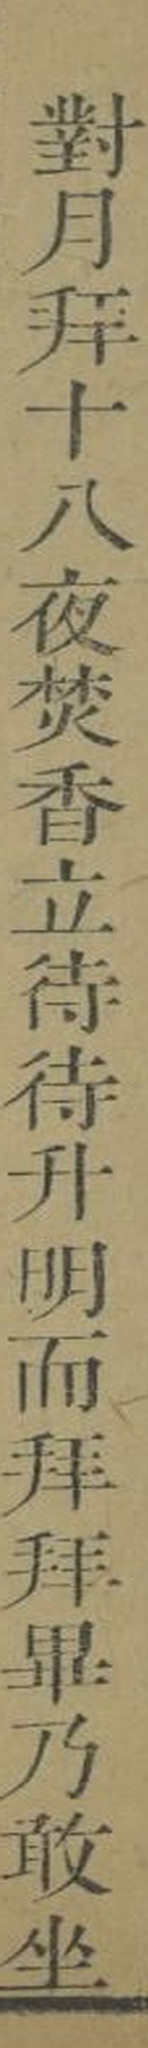対月拝十八夜焚香立待待升明而拝拝畢乃敢坐
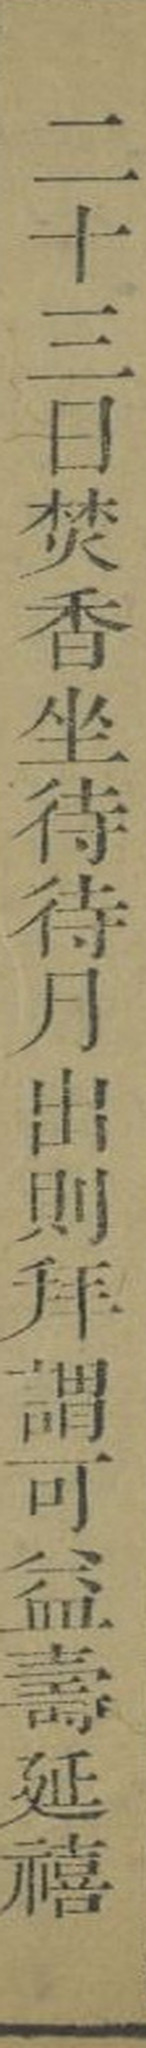二十三日焚香坐待待月出則拝謂可益寿延禧
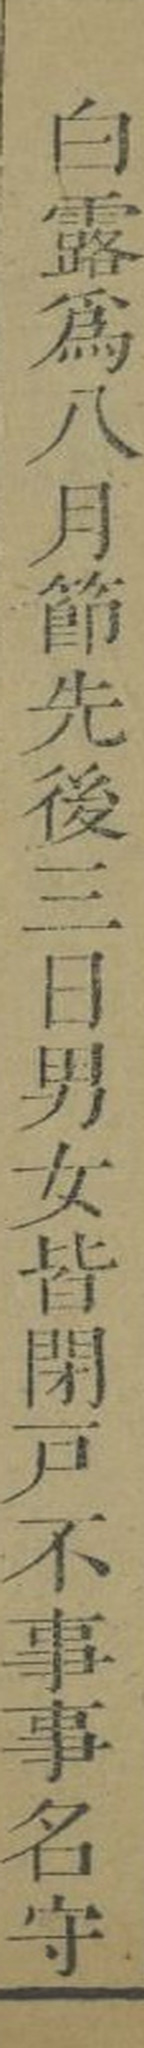白露為八月節先後三日男女皆閉戸不事事名守
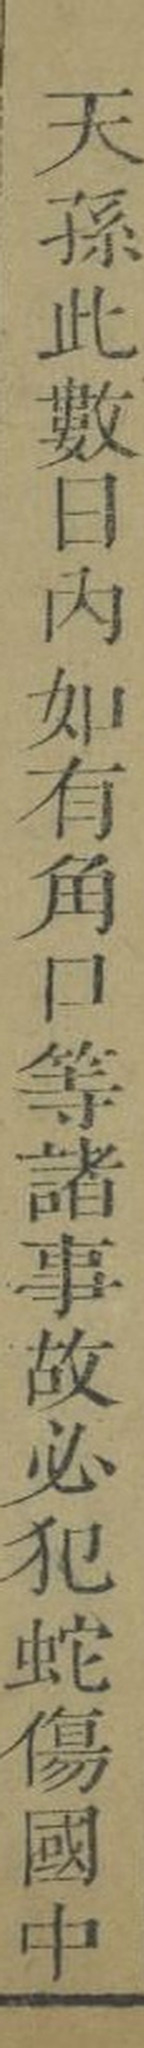天孫此数日内如有角口等諸事故必犯蛇傷国中
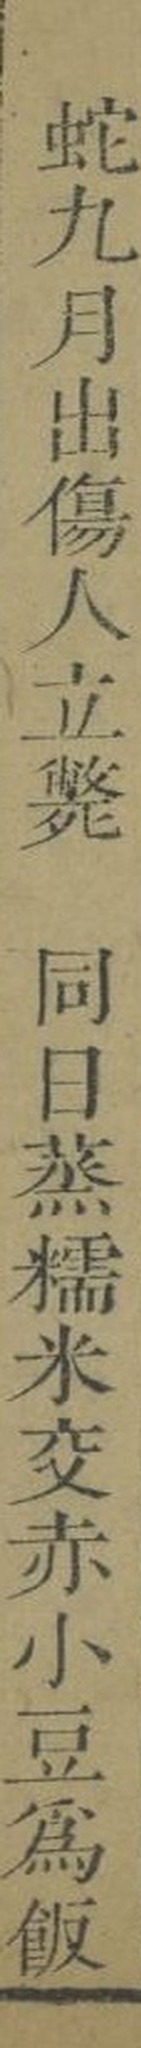蛇九月出傷人立斃同日蒸糯米交赤小豆為飯
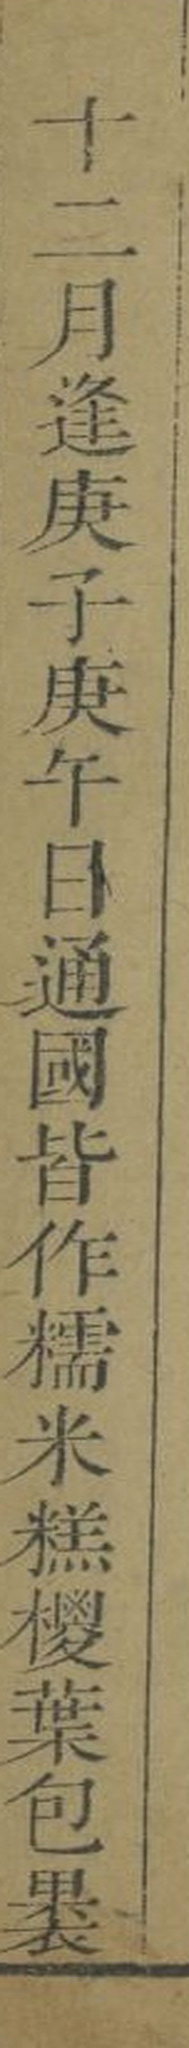十二月逢庚子庚午日通国皆作糯米糕棕葉包褁

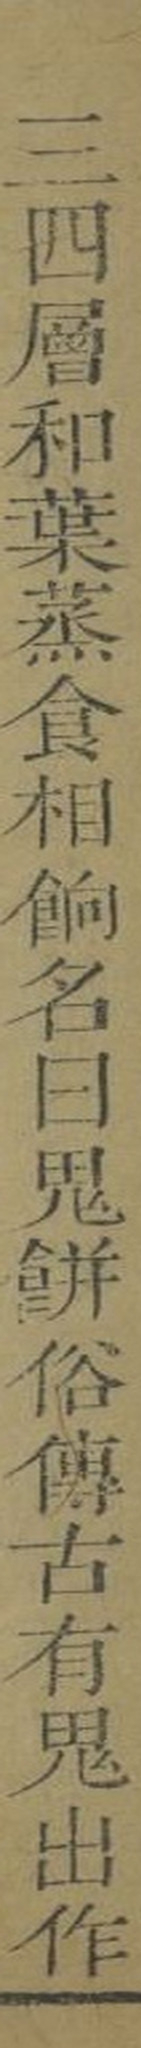三四層和葉蒸食相餉名曰鬼餅俗伝古有鬼出作
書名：中山伝信録 巻六
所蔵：University of the Ryukyus Library
